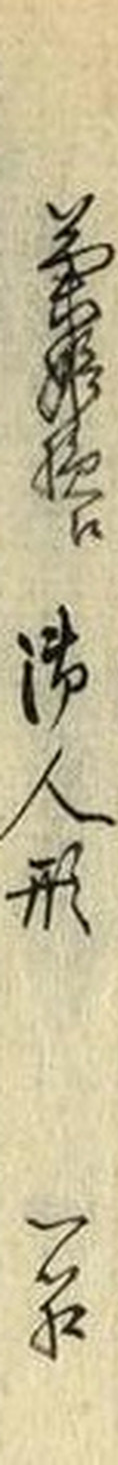菊姫様江御人形一箱
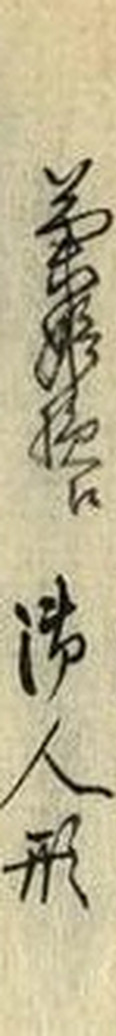菊姫様江御人形一箱
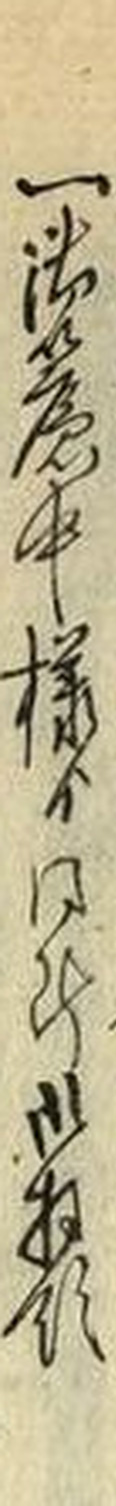一御簾中様ゟ同断御拝領
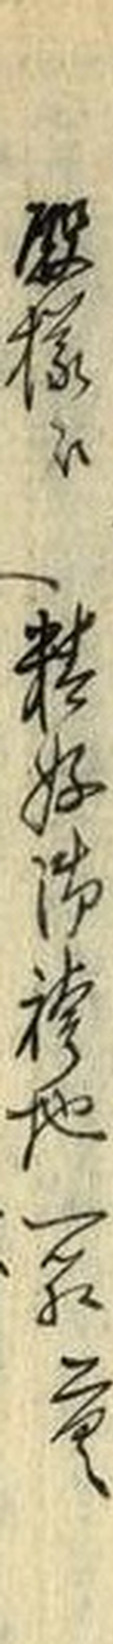殿様江精好御袴地一箱二具
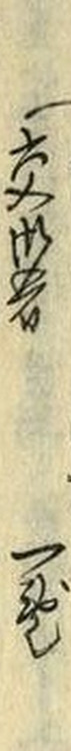交御肴一台
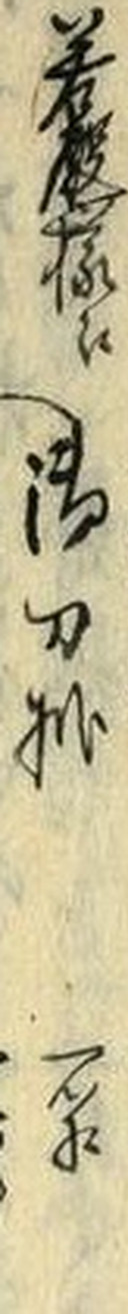若殿様江御刀掛一箱
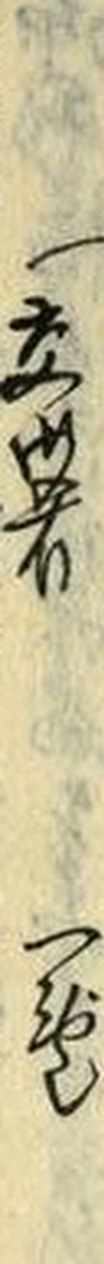交御肴一台
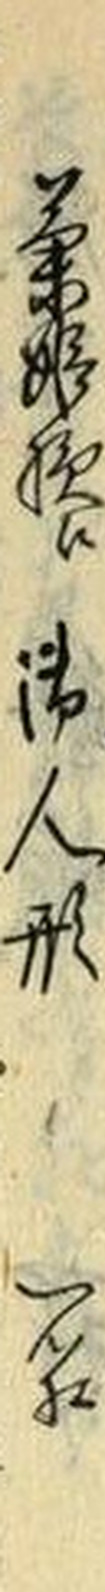菊姫様江御人形一箱
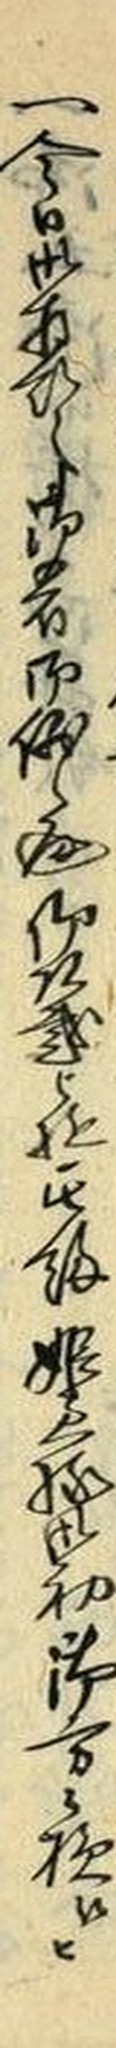一今日御拝領之御肴御例之通御頂戴被遊其餘姫君様御初御方々様江被
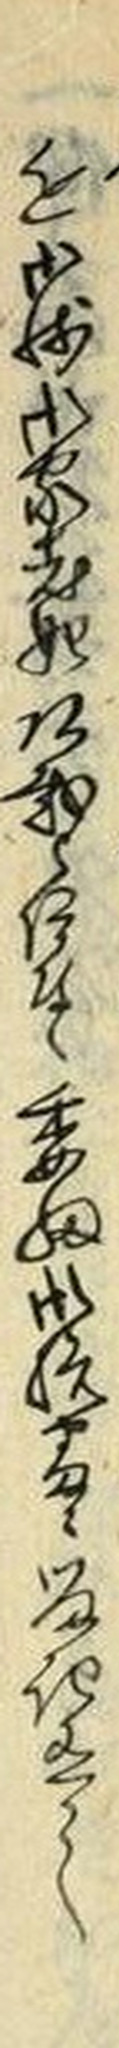進御残御家老始頂戴被仰付候委細御膳番留記有之
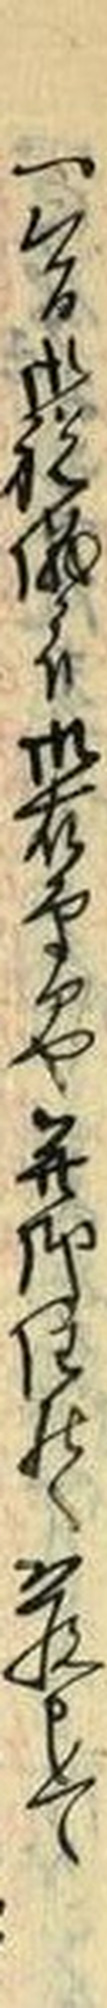一今日御祝儀ニ付御右筆部や并御住居へ恐悦申上候
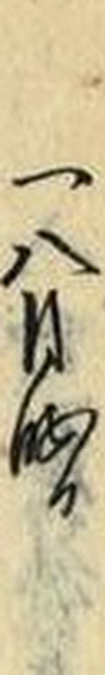一八月晦日
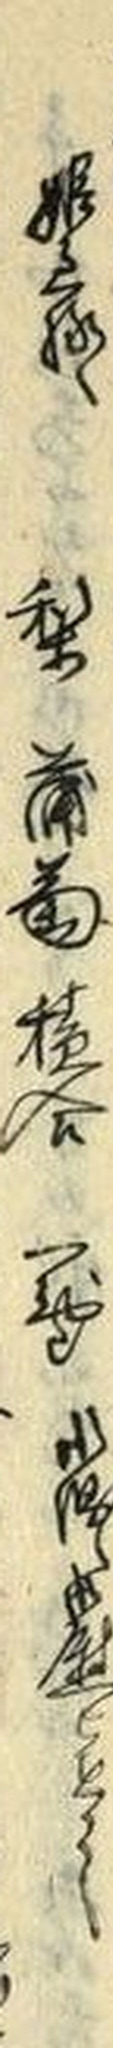姫君様へ梨葡萄積合一台御側御慰被進之
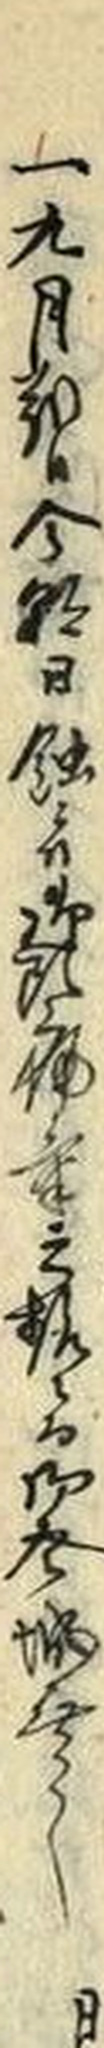一九月朔日今朝日蝕ニ付御頭痛重之趣ニ而御登城無之
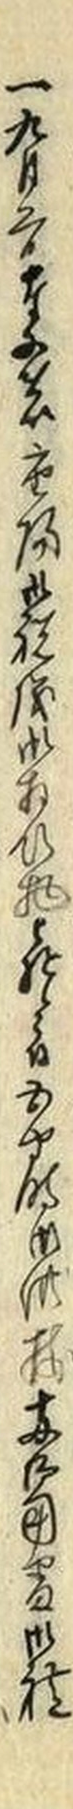一九月二日奉文を以重陽御祝儀御拝領物被遊候ニ付五半時御供揃両御用番御礼
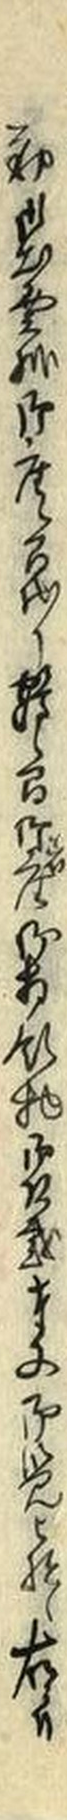勤御出殿掛御座之間代り鶴之間御着座御拝領物御頂戴奉文御覧被遊候右ニ付
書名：少傅日録抄（斉承付側向頭取日記、在府）
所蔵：福井県文書館 Fukui Prefectural Archives
